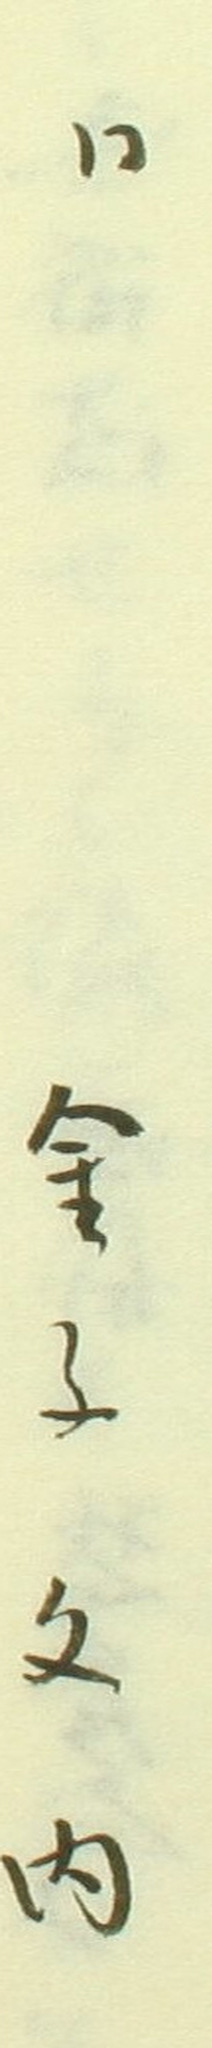同金子文内
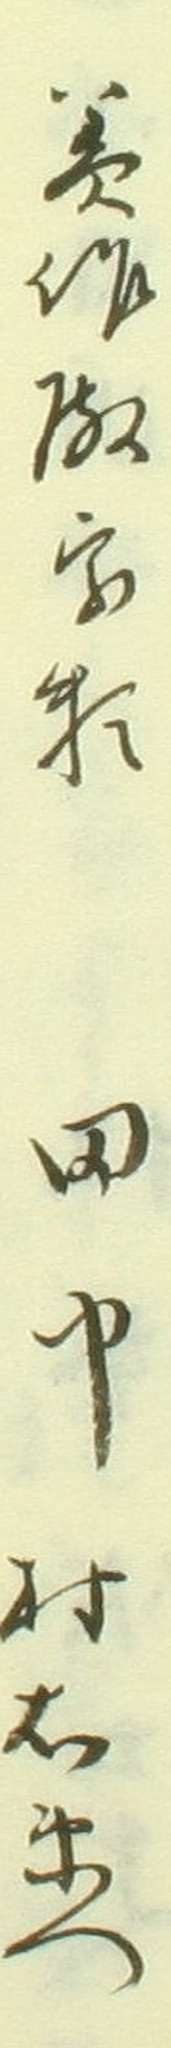美作殿家頼田中村右衛門
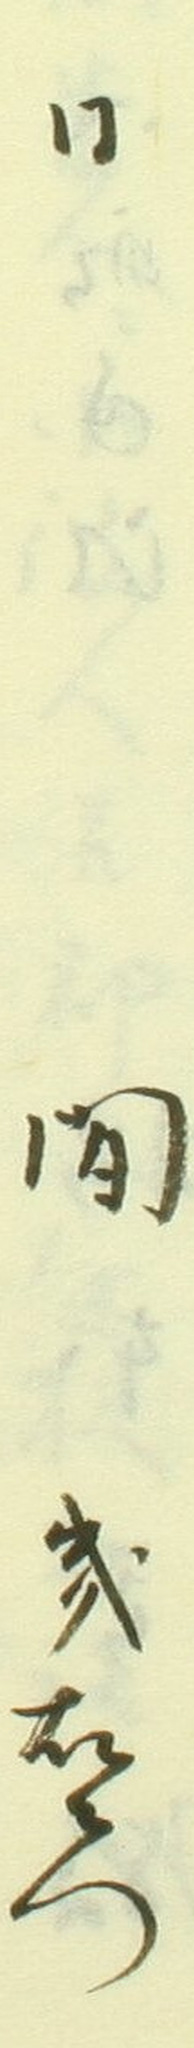同間幾右衛門
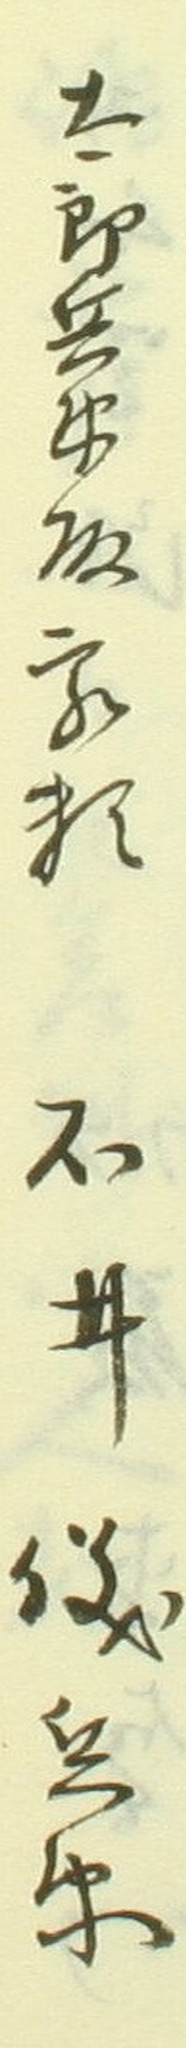太郎兵衛殿家頼石井儀兵衛
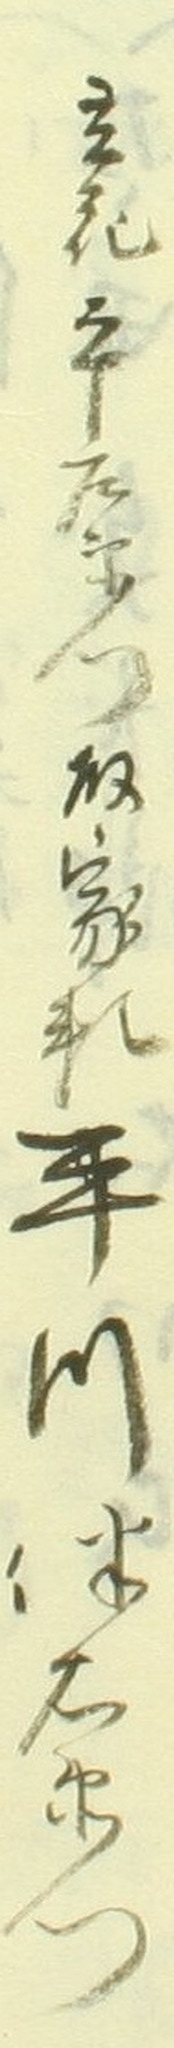玄花平右衛門殿家頼平川伴右衛門
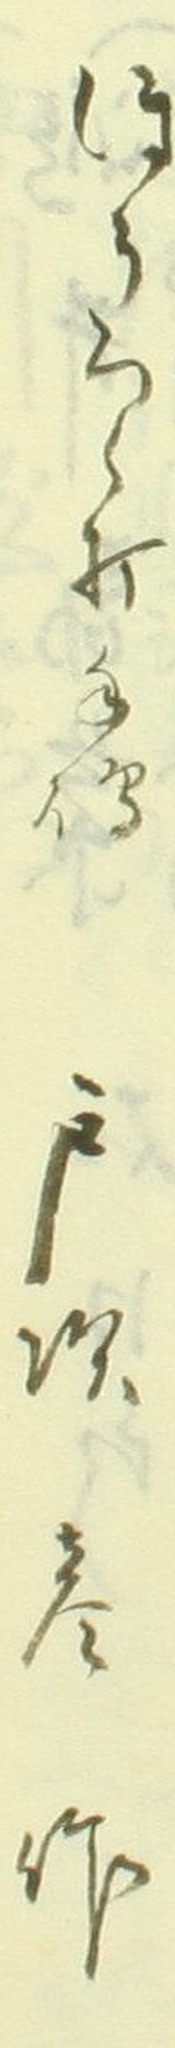ほうろく打手伝戸？彦作
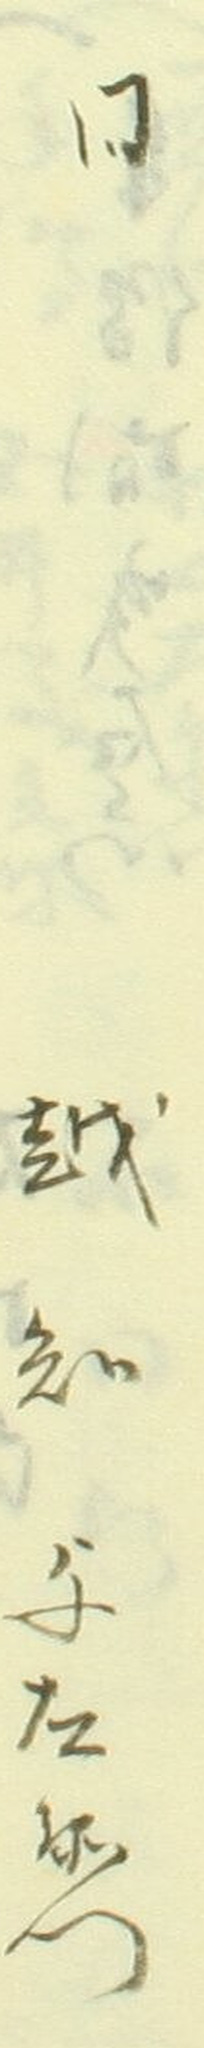同越知与左衛門
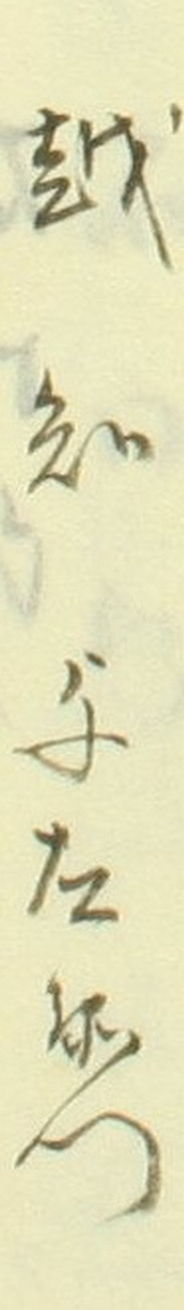同越知与左衛門
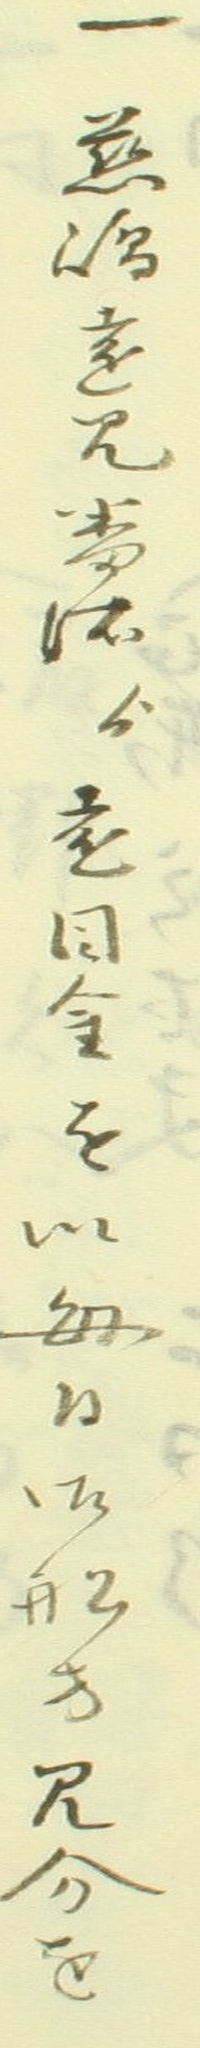一慈嶋遠見番所ゟ遠見金を以毎日御船方見分を
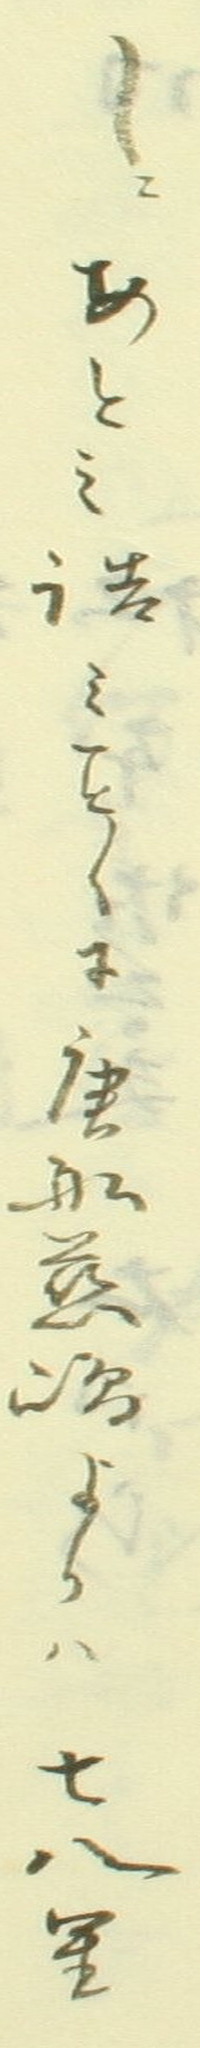しにあと之詰之ことくに唐船慈嶋よりは七八里
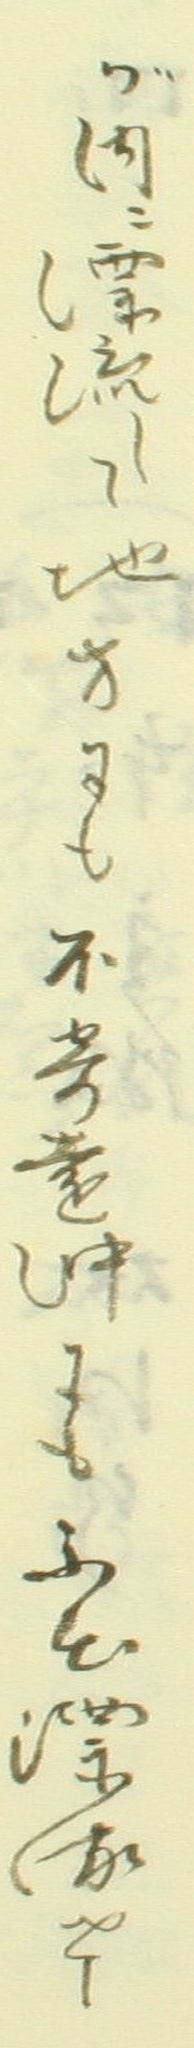が内に漂流して地方にも不寄遠沖にも不出漂流をし
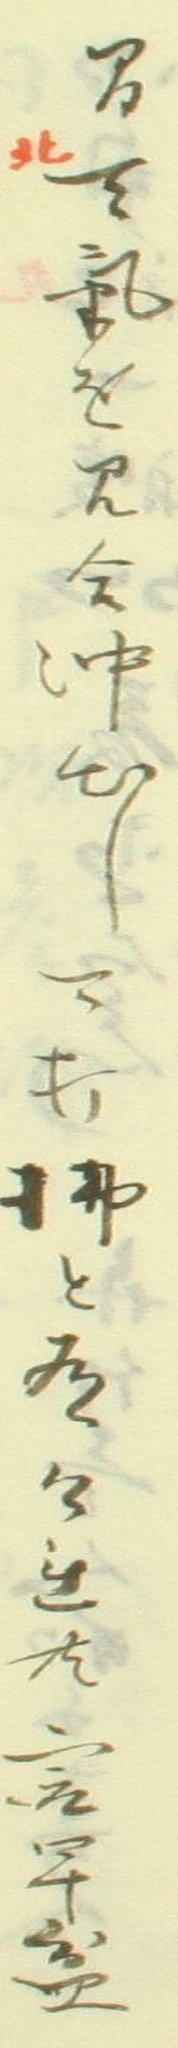間天気を見合沖出して打払と有けれ共最早分？
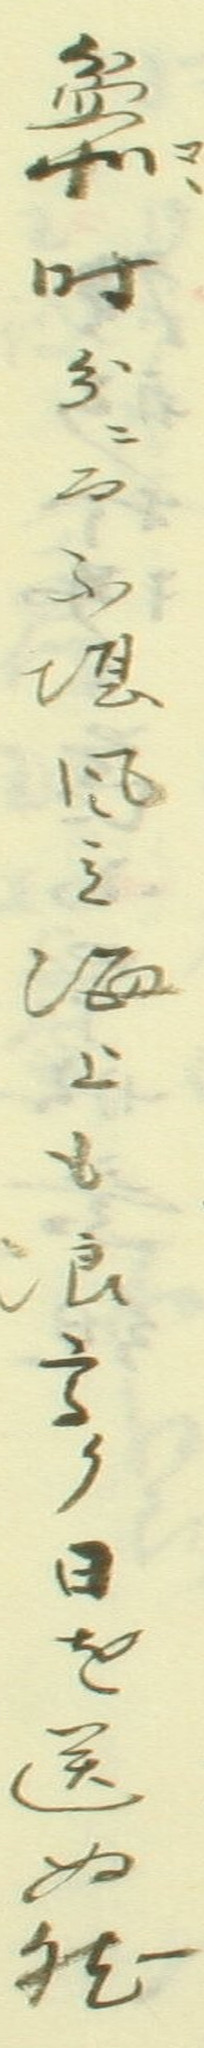盆？時分に而不堪風立海上も浪高く日を送ぬ然
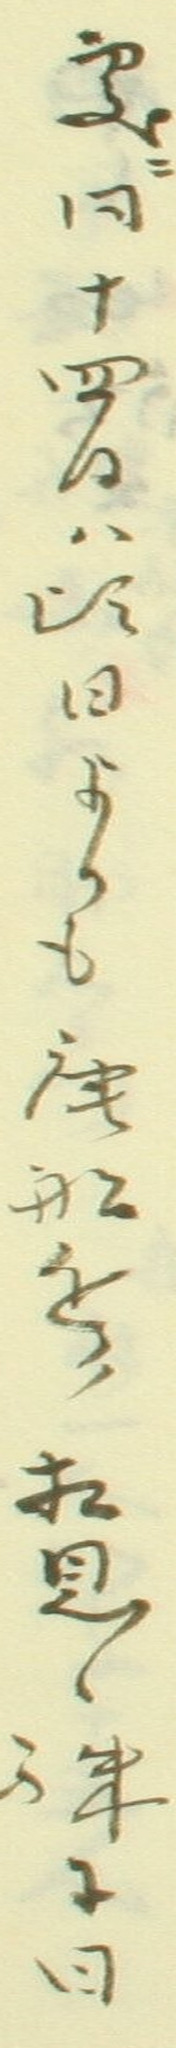處に同十四日は頃日よりも唐船近く相見候殊に日
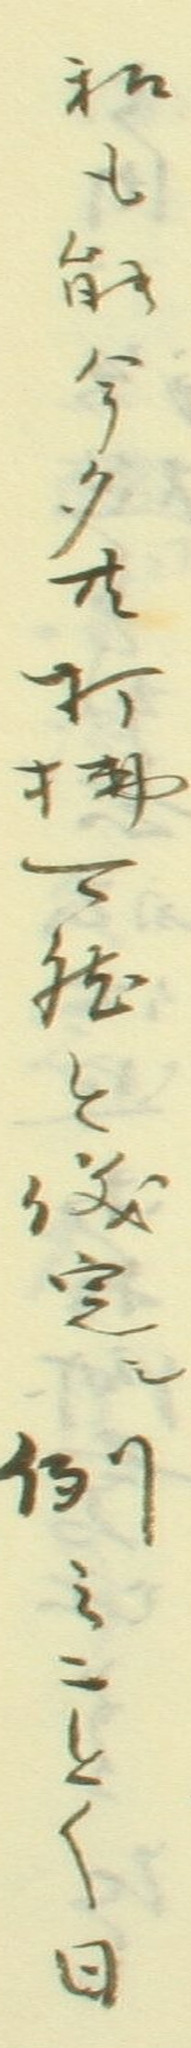和も能今夕共打払可然と儀定し例之ことく日

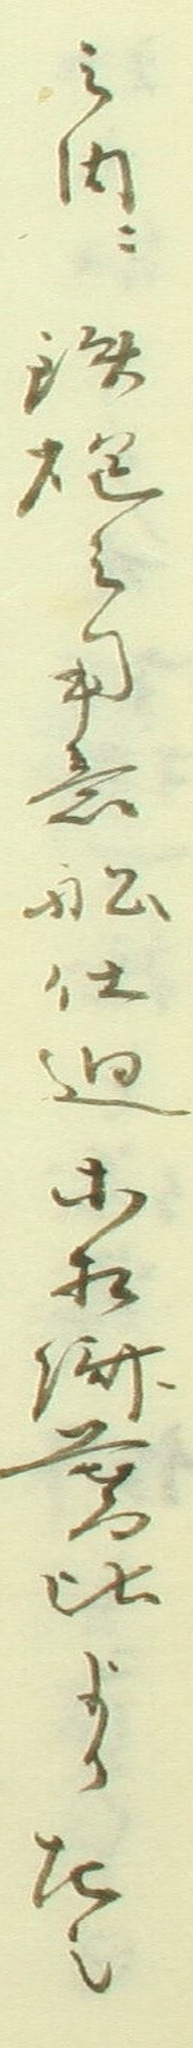之内に鉄砲之用意船仕廻等相済暮頃ゟ左之
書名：唐船漂流記 三
